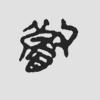{睿攴}
